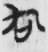叴
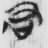君
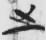之
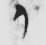人
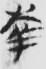南
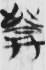登
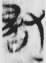敢
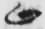○（廷）
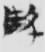阩
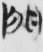門
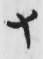又
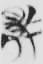敗
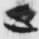疋
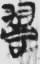○（旌）
